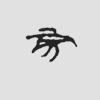旁
